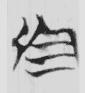於
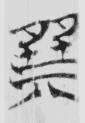巽
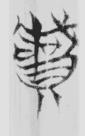{爿或貝}
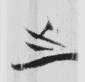之
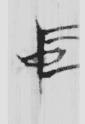𠁩
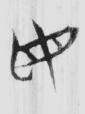母
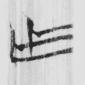乍
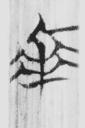手
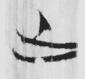止
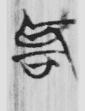{㠯ㅋ}
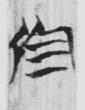於
